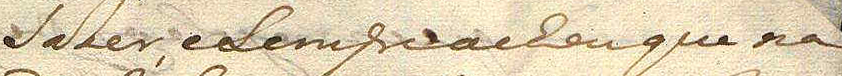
saber, e sempre achou que na
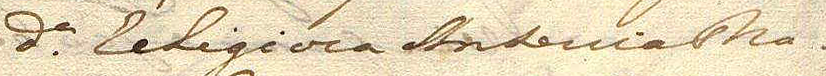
d.a Religioza Antonia Ma
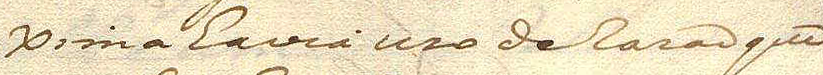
xima havia uzo da Razão que
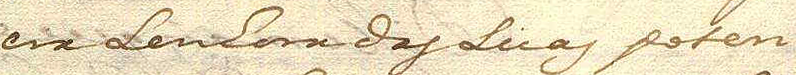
era senhora das suas poten
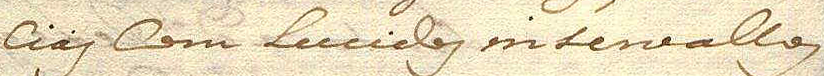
cias com lucidos intervallos
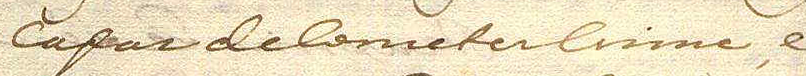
capaz de Cometer Crime, e
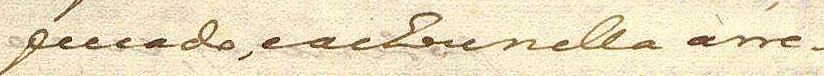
peccado, e achou nella arre
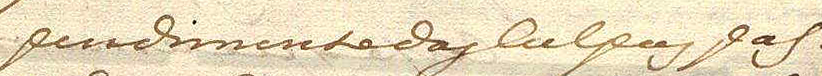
pendimento das Culpas pas
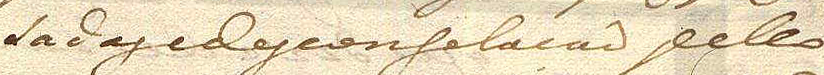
sadas e desconsolaçaõ pello
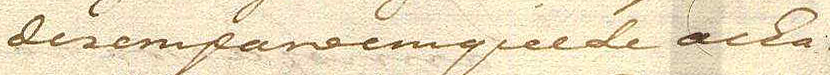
dezemparo em que se acha
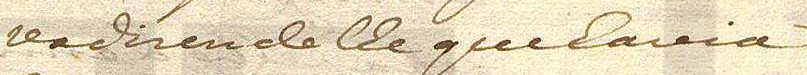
va dizendolhe que havia
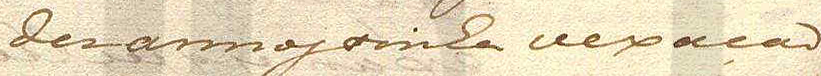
dez annos tinha vexaçaõ
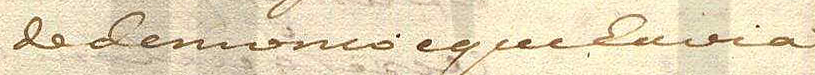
de demonio e que havia
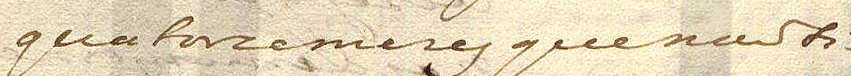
quatorze mezes que naõ ti
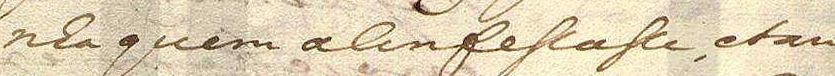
nha quem a Confessasse, e tam
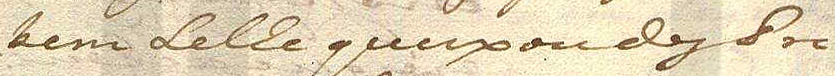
bem se lhe queixou dos Pre
